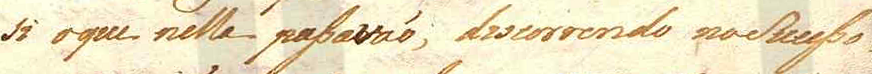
si o que nella passavaõ, descorrendo no Recesso,
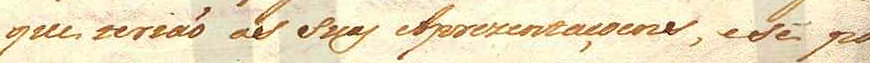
que teriaõ ás suas Aprezentaçoens, e se po
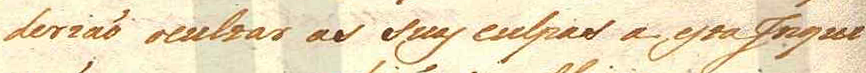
deriaõ ocultar as suas culpas a esta Jnqui
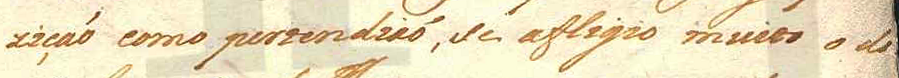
ziçaõ como pertendiaõ, se afligio muito o do
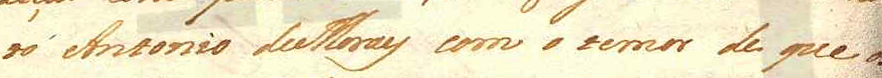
tó Antonio de Morais com o temor de que o
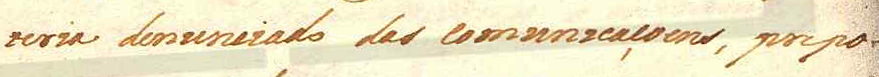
teria denunciado das comunicaçoens, prepo
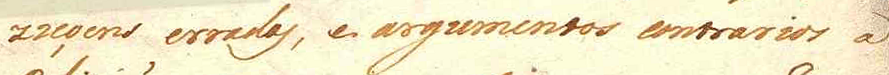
ziçoens erradas, e argumentos contrarios a
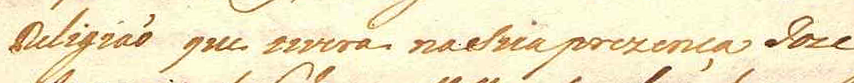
Religiaõ que tivera na sua prezença Ioze
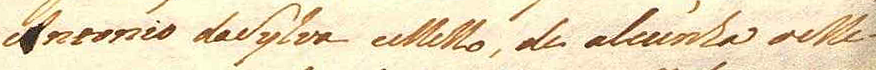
Antonio da Sylva e Mello, de alcunha o Me
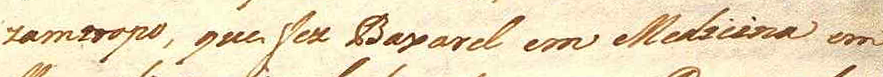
zamtropo, que fez Baxarel em Medicina em
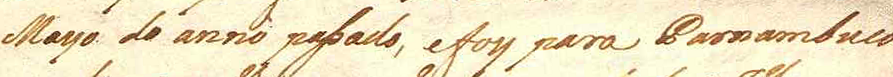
Mayo do anno passado, e foy para Parnambuco
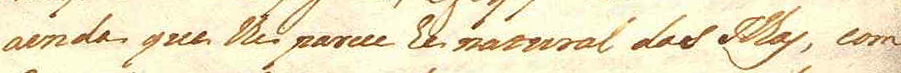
ainda que lhe parece he natural das Ilhas, com
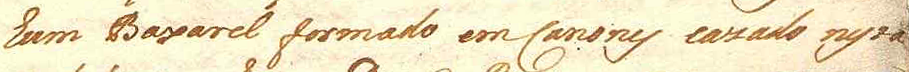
hum Baxarel formado em Canones cazado nesta
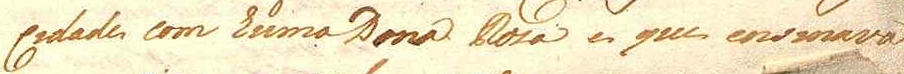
Cidade com huma Dona Roza e que ensinava
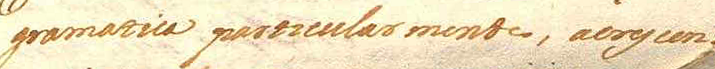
gramatica particularmente, acrescen
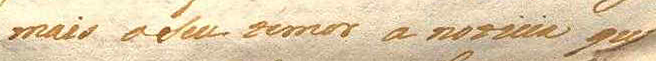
mais o seu temor a noticia que
